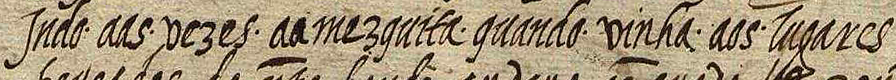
Jndo aas vezes aa mezquita quando vinha aos lugares
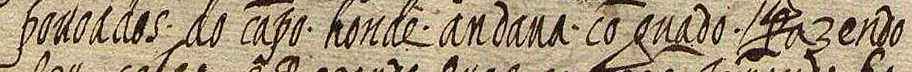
pouoados do cāpo honde andaua cō guado / fazendo
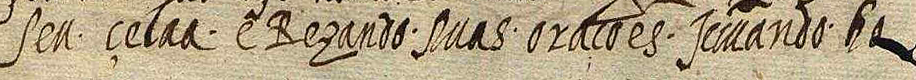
seu celaa e Rezando suas oraçoẽs Jeiuando ho
